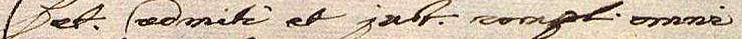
Pet. admiti ad just. compl. omni
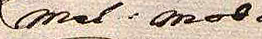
mal. modo.
